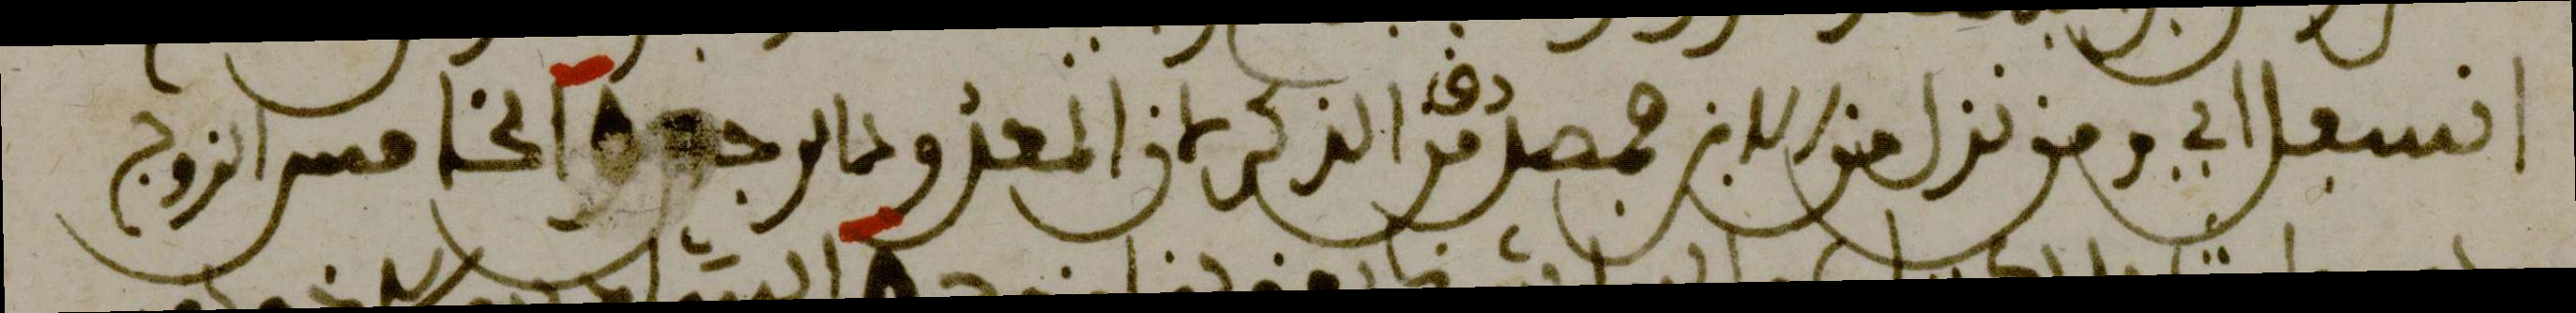انسفل اي ومن نزل من الابن فمصد من الذكر لان المعدود الرج والخامس الزوج
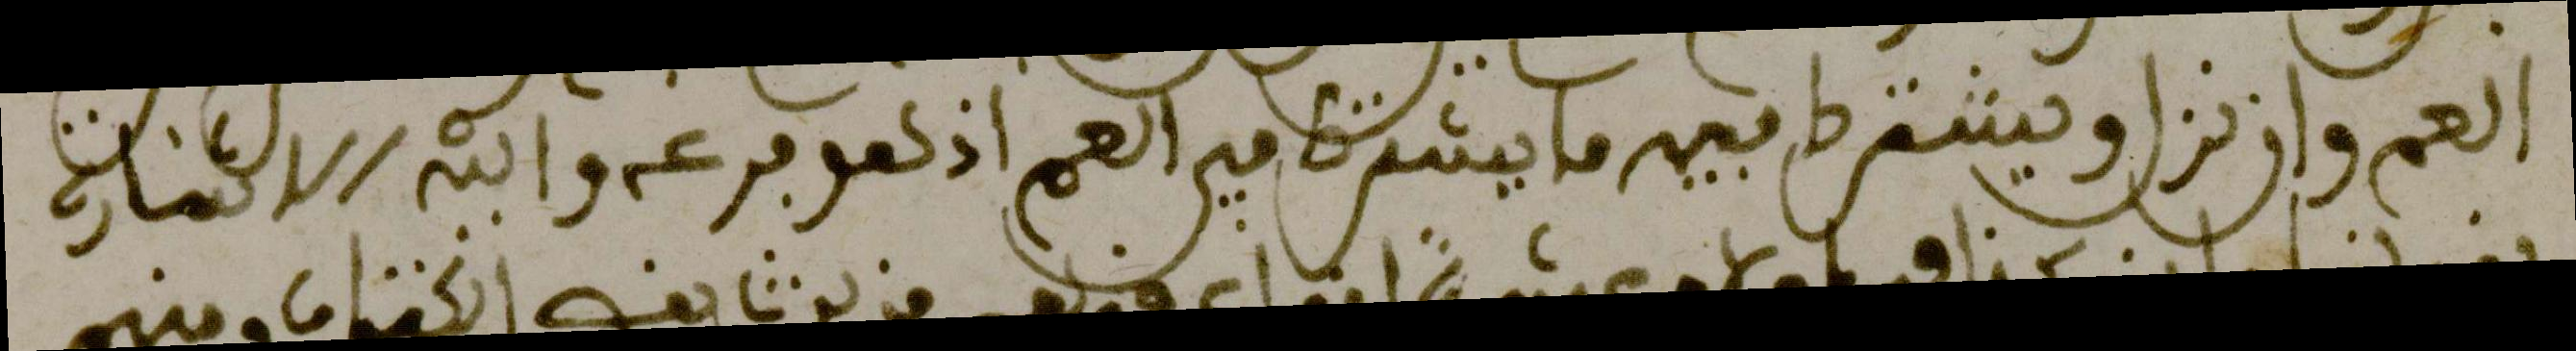العم وان نزل ويشترط فيه ما يشترط في العم اذ هو فرعه واليْه الاشارة
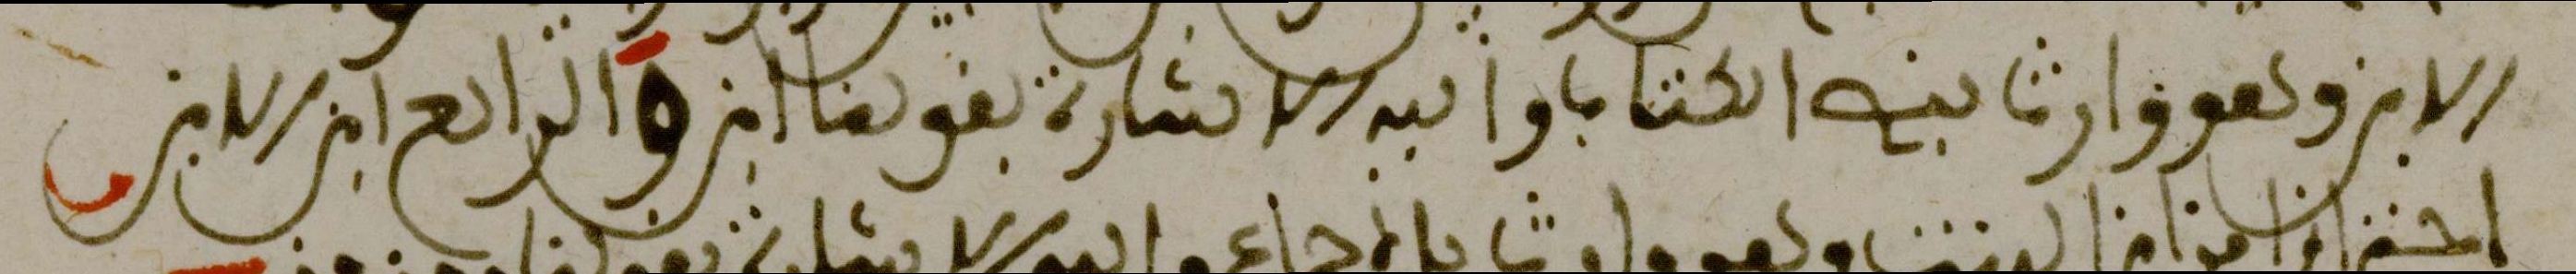الابن وهو وارث بنص الكتاب واليه الاشارة بقولنا ابن والرابع ابن الابن
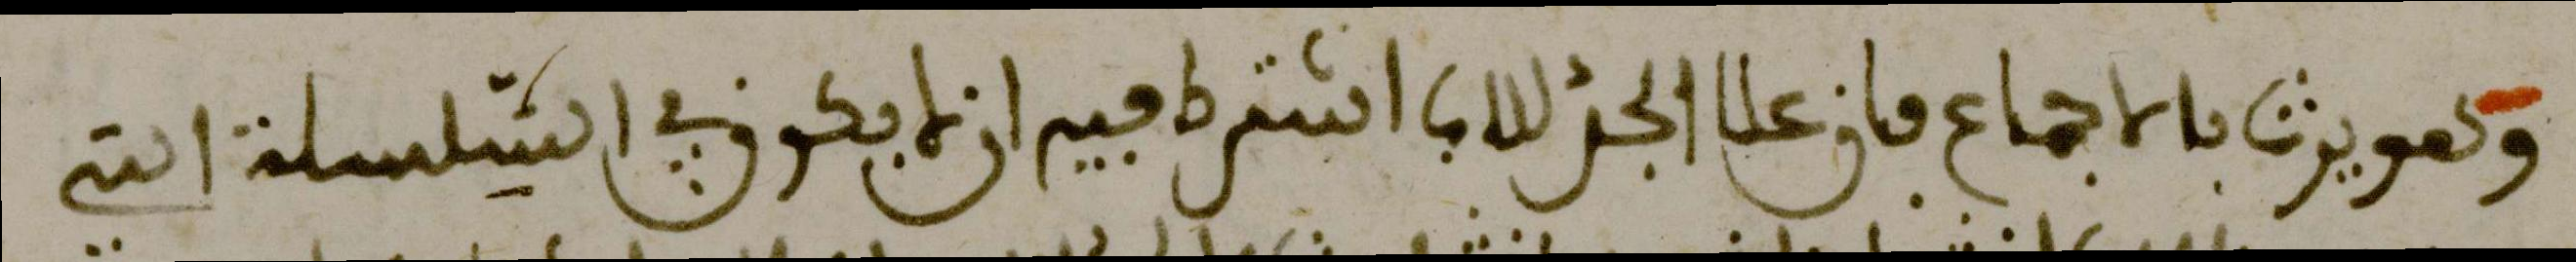وهو يرث بالاجماع فان علا الجد للاب اشترط فيه ان لا يكون في السّلسلة التي
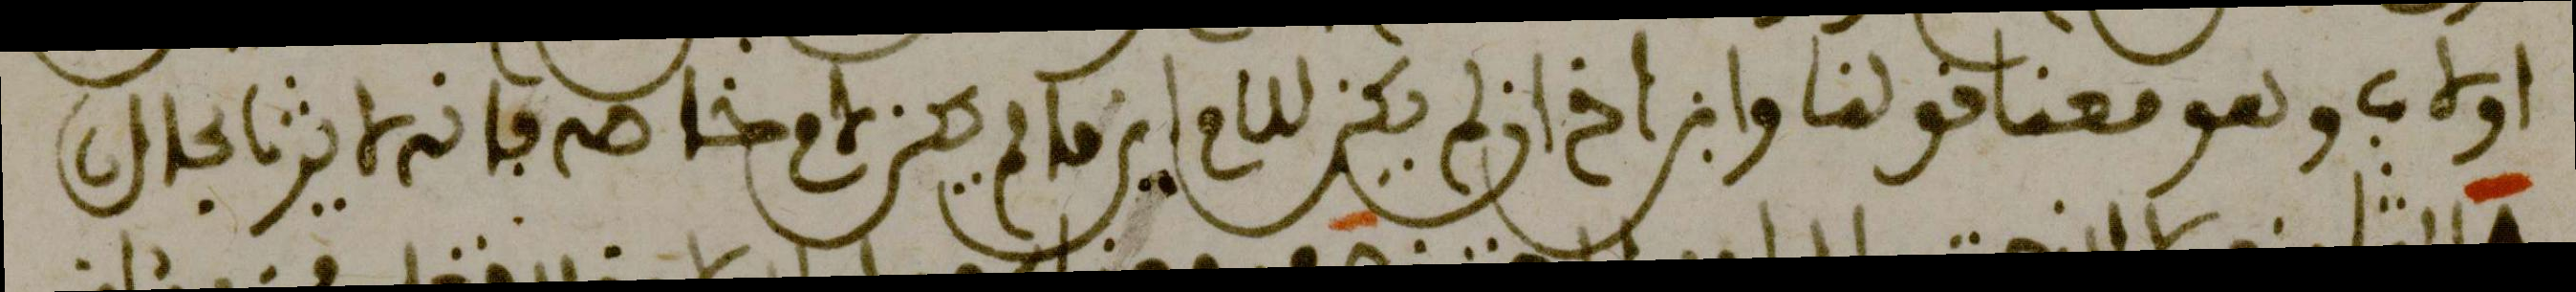او لاب وهو معنا قولنا وابن اخ ان لم يكن للام اي ما لم يكن لام خاصه فانه لا يرث بحال
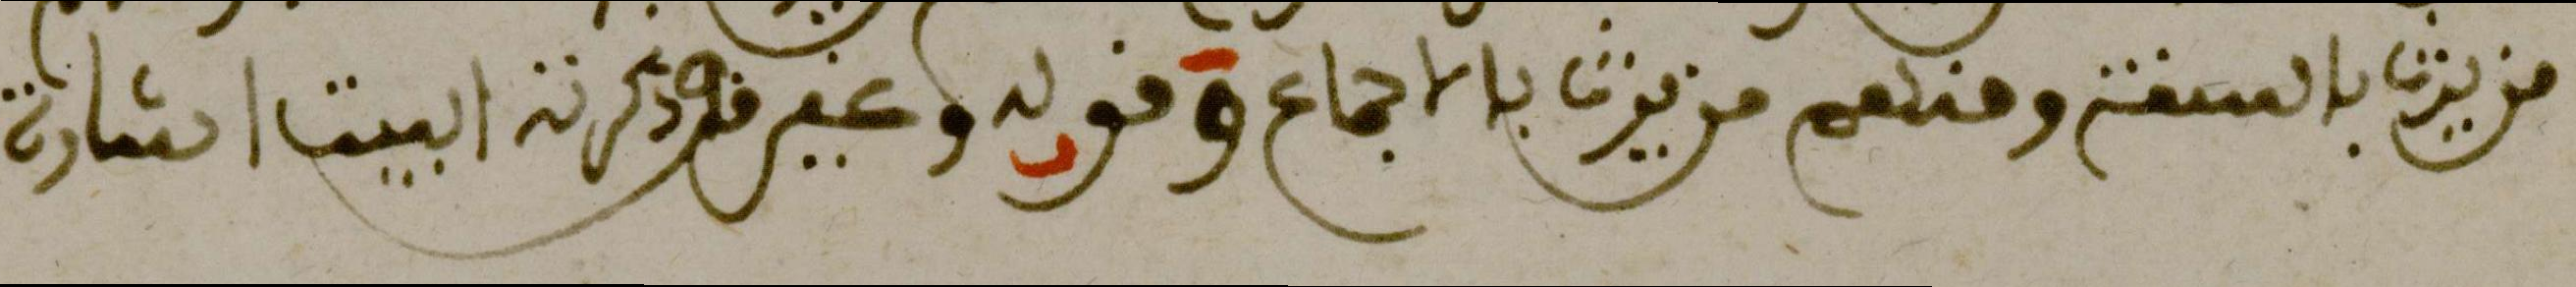من يرث بالسنة ومنهم من يرث بالاجماع وقوله وغير من ذكرته البيت اشارة
